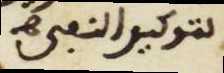لتوكيد النفى ه
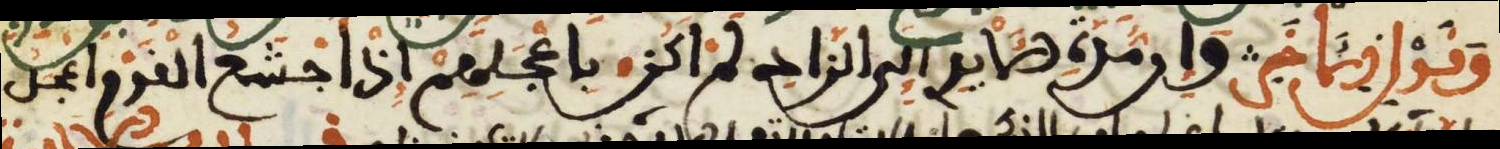وقول #ما خبر وان مدة اليدم الى الزاد لم اكن باعجلهم اذ اجشع القوم اعجل
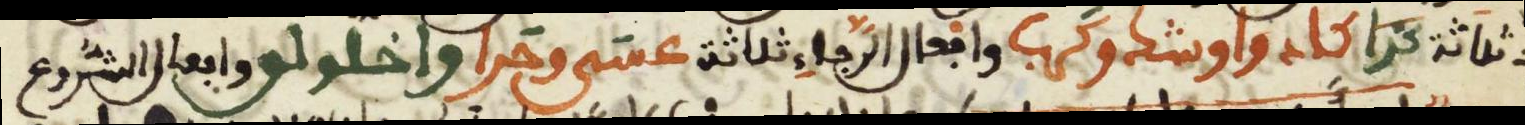ثلاثة كذا كا# واوشك و ك#ب فافعال الرجاء ثلاثة عسى وحرا و اخلولق أفعال الشروع
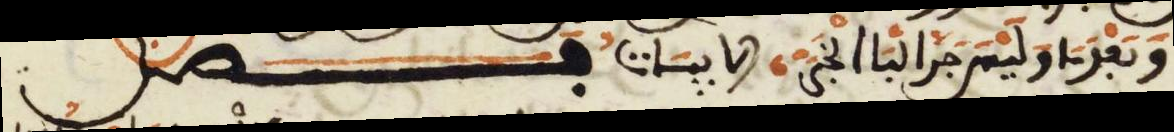و بعرما و ليس جرالبا الخبر الابيات فصل
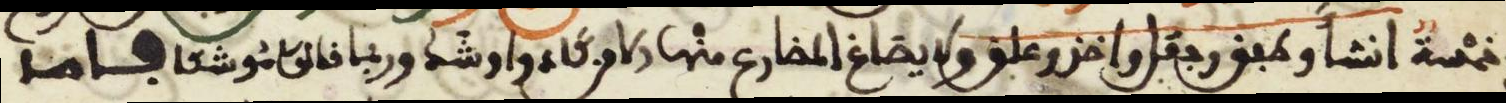خمسة انشأ و طفق و جعل و اخذ و علق و لا يصاغ المضارع منها و لا من كاد واوشك و ربما قالوا موشكا فاما
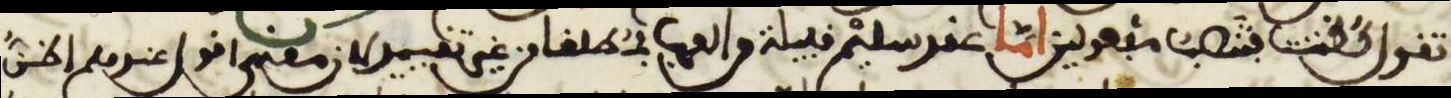تقول ككن# فتنصب مفعولين اما عند سليم قبيلة من العمر فمطلقا من غير تقييد لان معنى أقول عندهم اظن
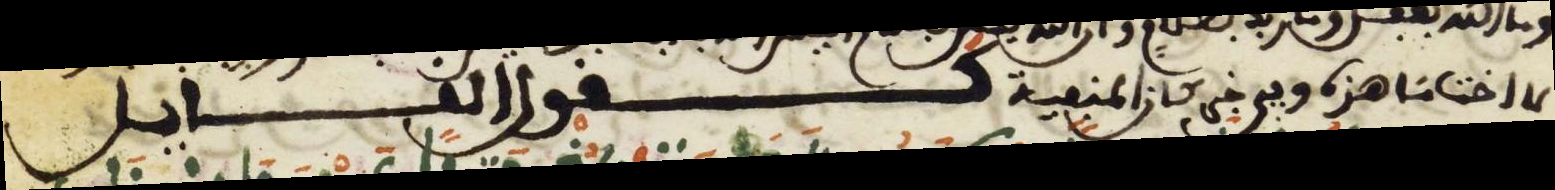لا اخت ما هذه ويبى خبر كان المنفية كقول القايل
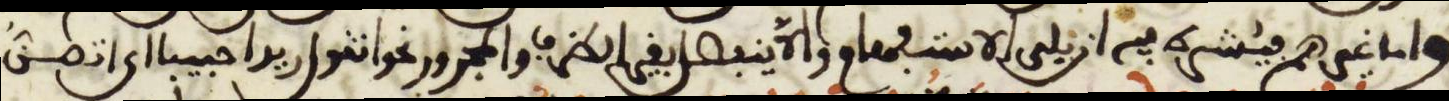واما غيرهم فيشرط فيه ان يلى الاستفهام و الا ينف# بفي الظرف و المجرور نحو اتقول زيدا حبيبا أى اتصن
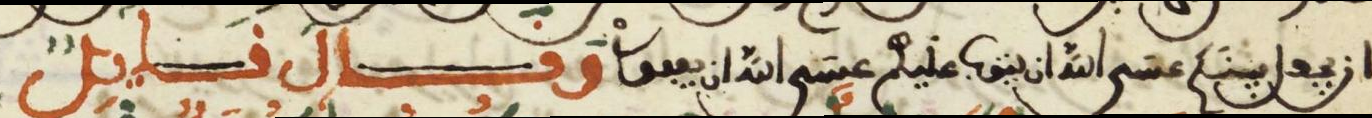ان يجعل بينكم عسى الله ان ينقب عليهم عسى الله ان يف# و قال قايل
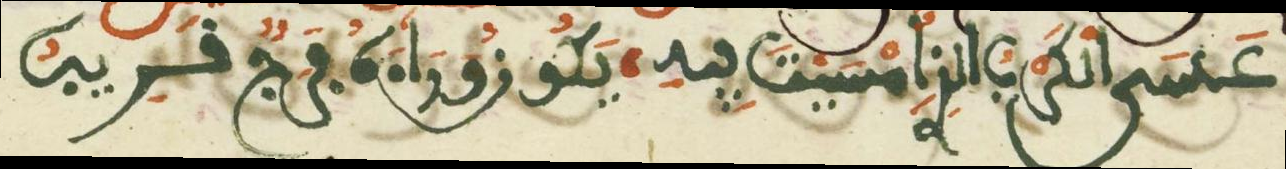ذى أمسيت فيه يكون وراءه م فرج قري
